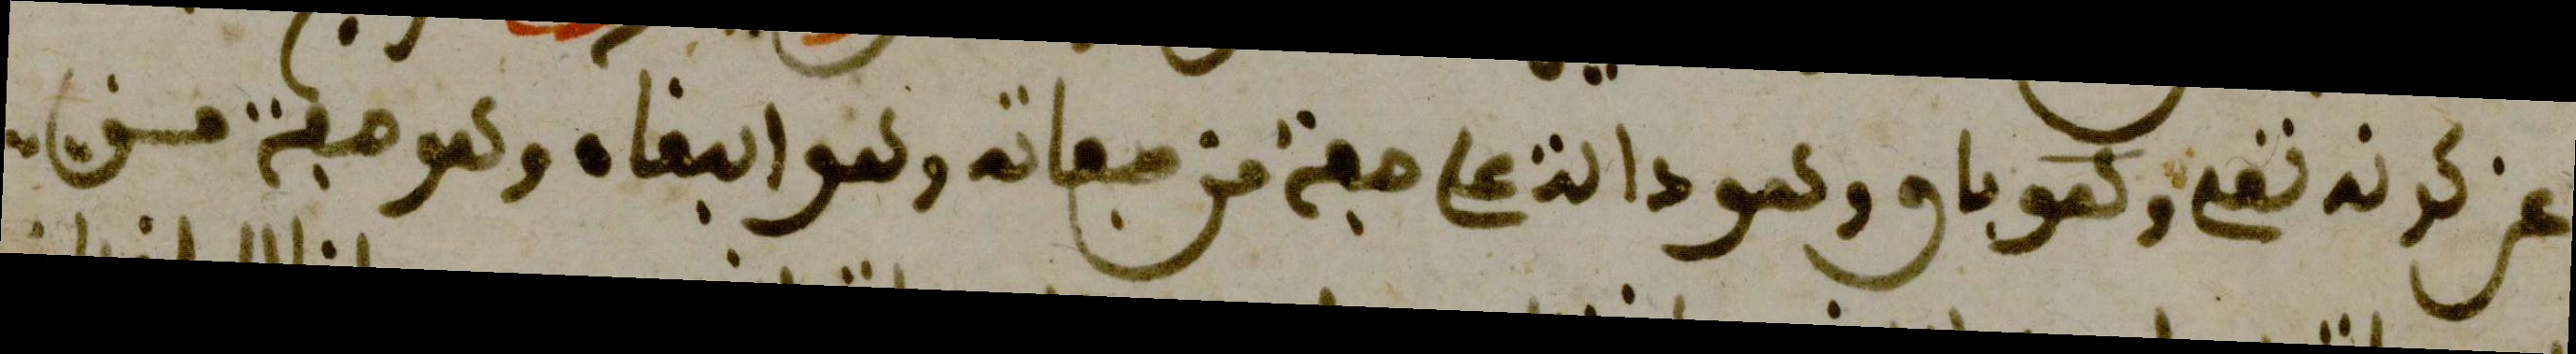عن كونه تعلى وهو باق وهو دالة على صفة من صفاته وهو البقاء وهو صفة من
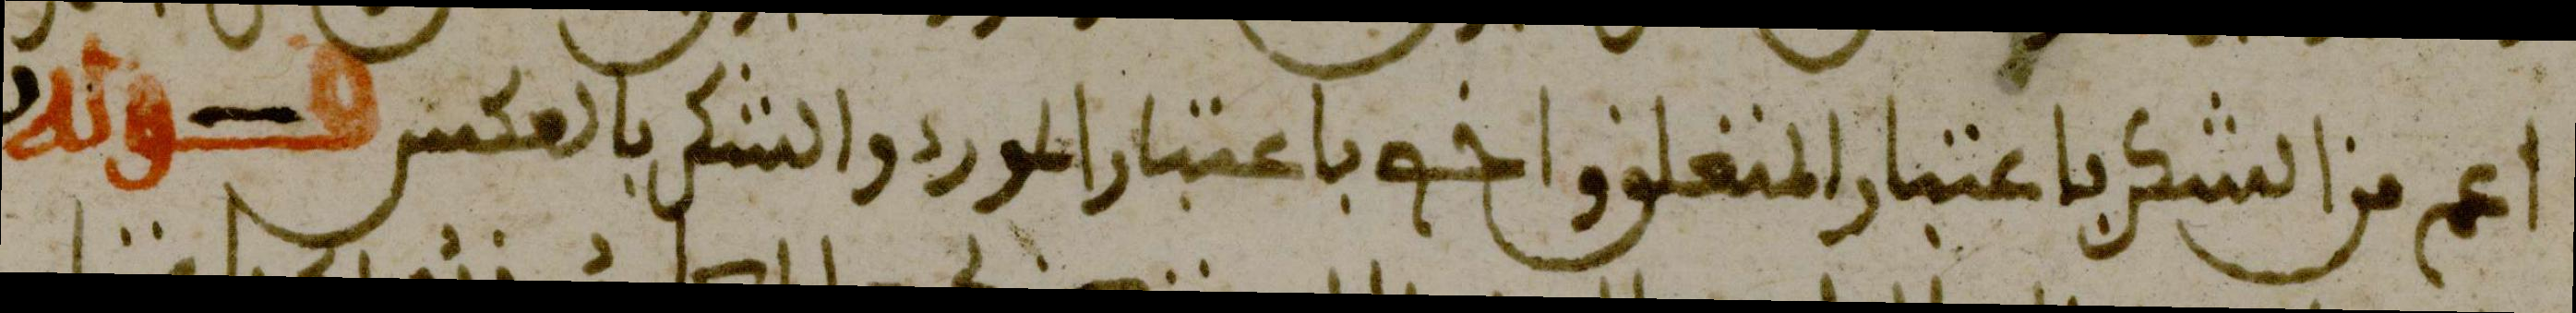ُاعم من الشكر باعتبار المتعلق واخص باعتبار المورد والشكر بالعكس قَوله
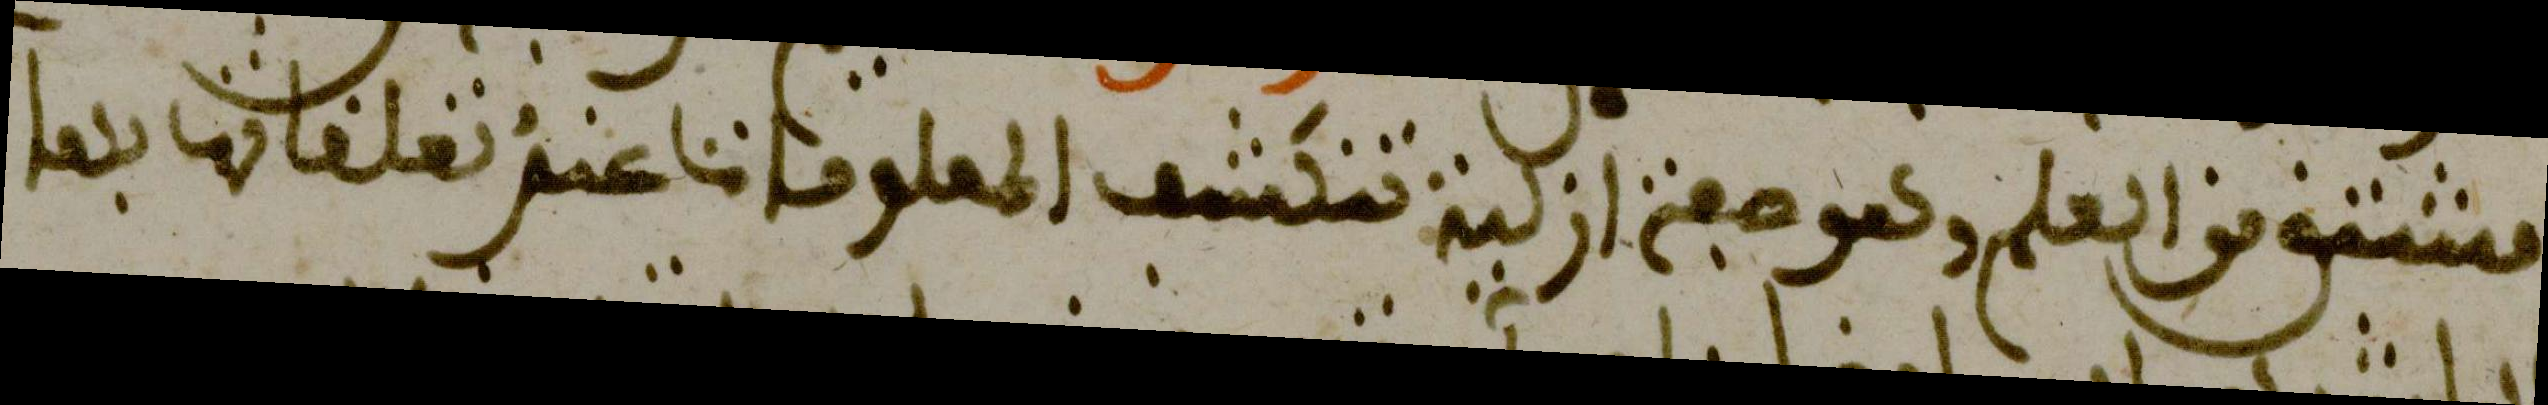مشتق من العلم وهو صفة ازلية تنكشف المعلومات عند تعلقاتها بها
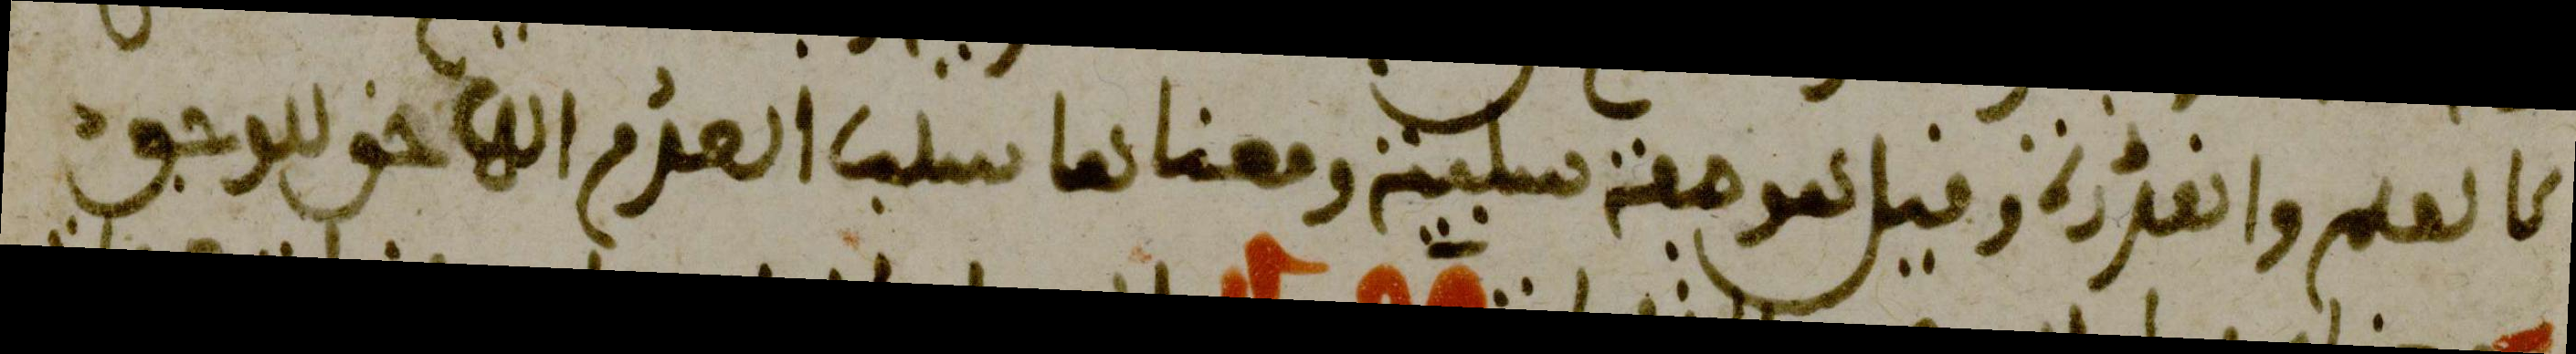كالعلم والقدرة وقيل هو صفة سلبية ومعناها سلب العدم اللاحق للوجود
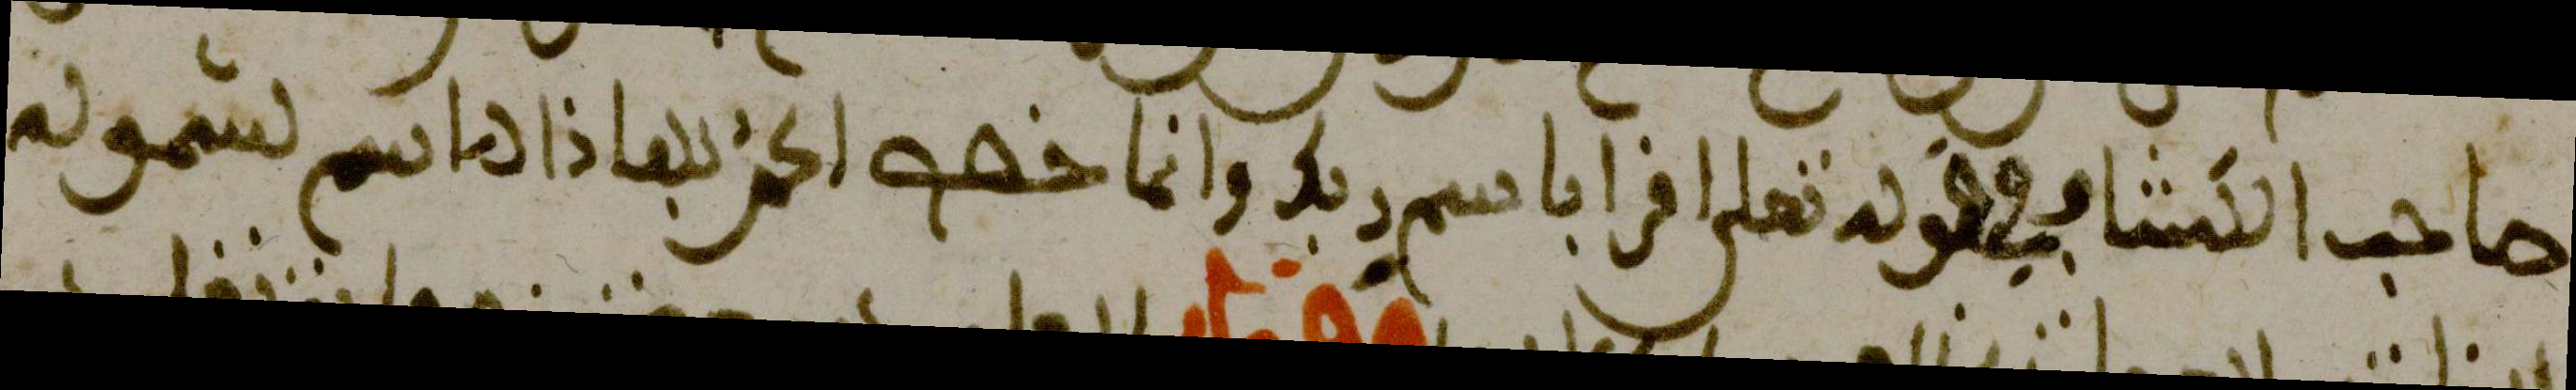صاحب الكشاف في قوله تعلى اقرا باسم ربك وانما خصص الحمد بهاذا الاسم لشمو له
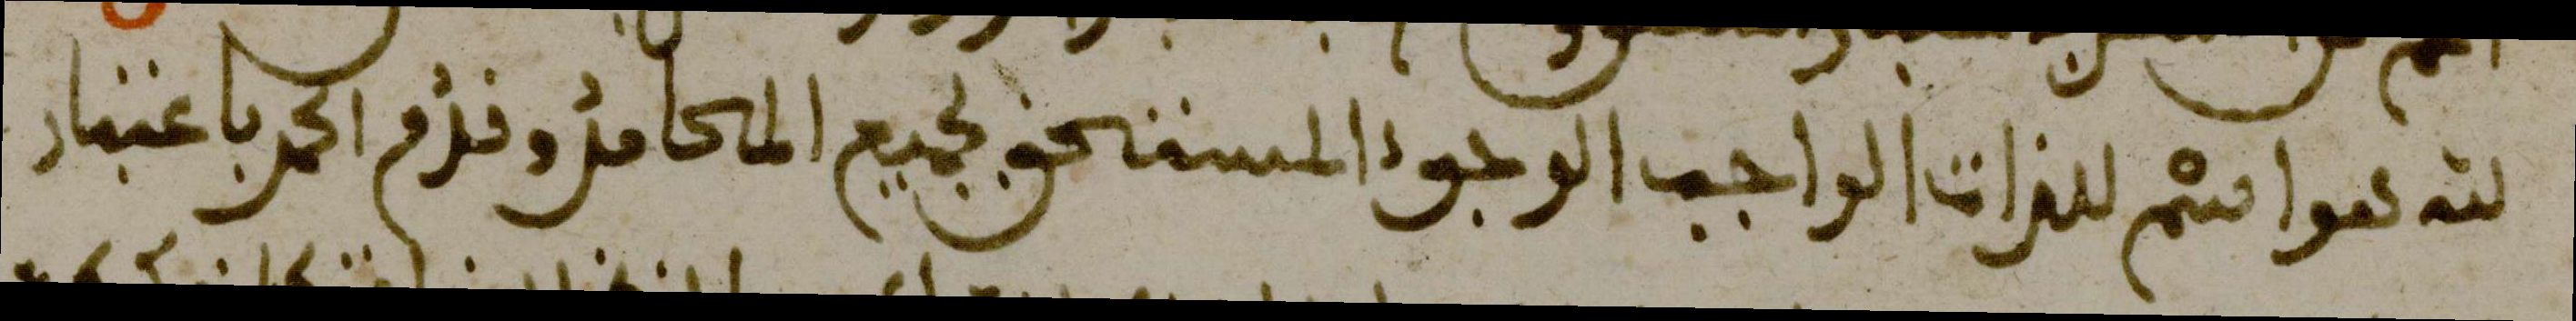لله هو اسْم للذات الواجب الوجود المستحق لجميع المحامد وقدم الحمد باعتبار
